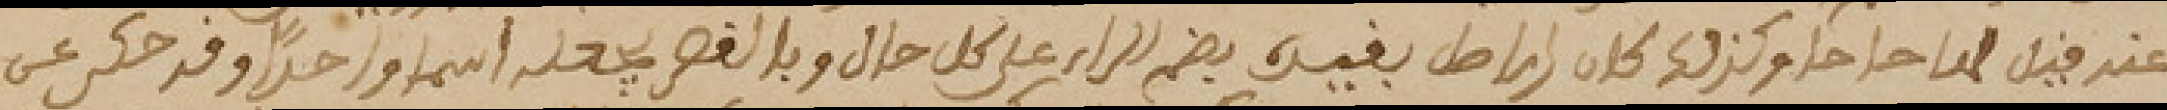عنه قيل لها حاحا وكذلك كان الا صل بقيده بضم الراء على كل حال وبالقصر يجعله اسما واحدا وقد حكى عن
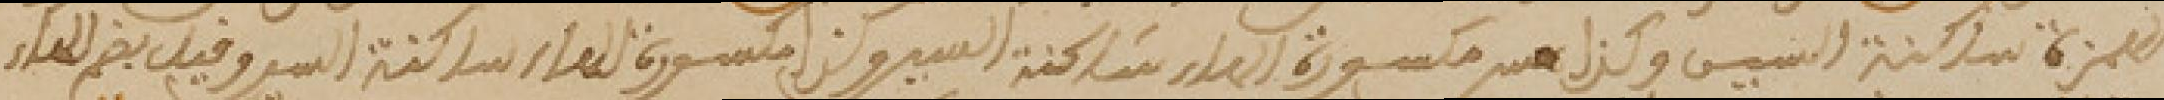الهمزة ساكنة السين وكذا هس مكسورة الهاء ساكنة السين وكذا مكسورة الهاء ساكنة السين وقيل بضم الهاء
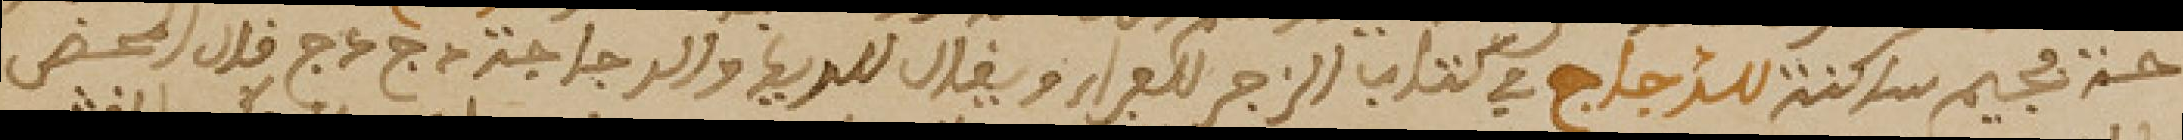حة فجيم ساكنة للدجاج في كتاب الزجر للقراء ويقال للديك والدجاجة دج دج قال المحض
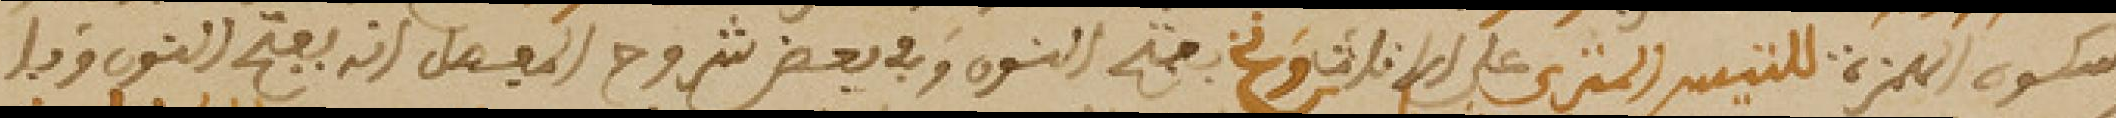سكون الهمزة للتيس المترى على الاناث ونخ بفتح النون وفي بعض شروح المفصل انه بفتح النون وبا
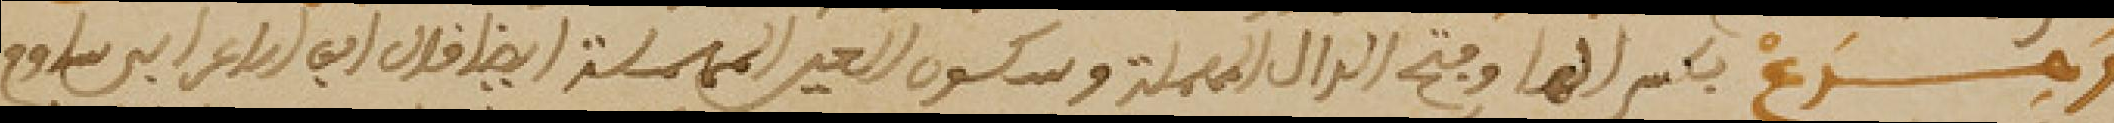وهدع بكسر الها وفتح الدال المهملة وسكون العين المهملة ايضا قال ابن الاعرابي ابن ساوم
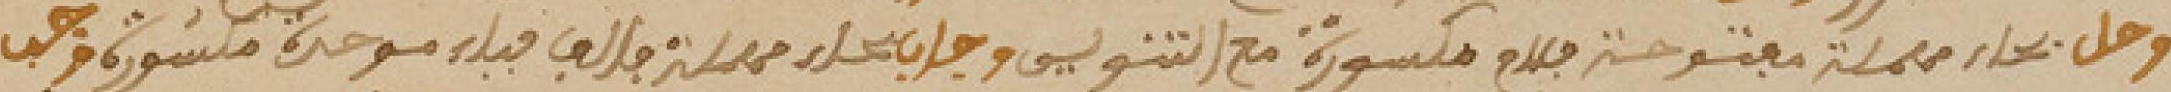وحل بحاء مهملة مفتوحة فلام مكسورة مع التنوين وجاب بحاء مهملة فالف فباء موحدة مكسورة وجب
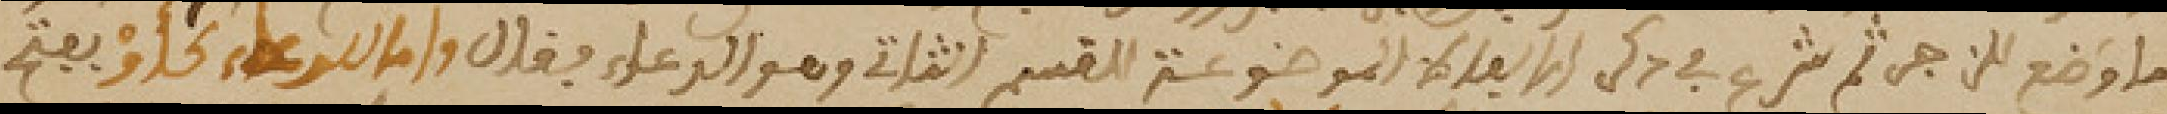ما وضع للزجر ثم شرع في ذكر الالفاظ الموضوعة للقسم الثاني وهو الدعاء فقال واما للدعاء كاو بفتح
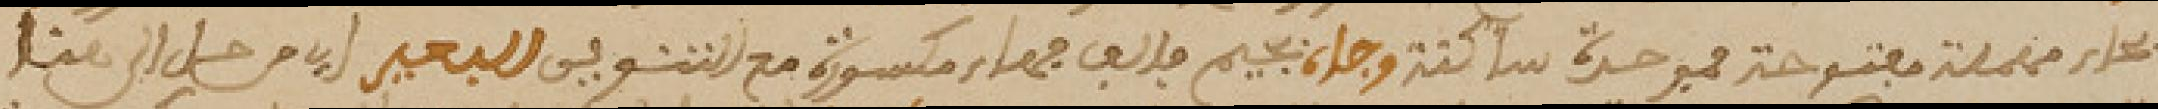بحاء مهملة مفتوحة فموحدة ساكنة وجاه بجيم فالف فهاء مكسورة مع التنوين للبعير أي من حل الى هنا
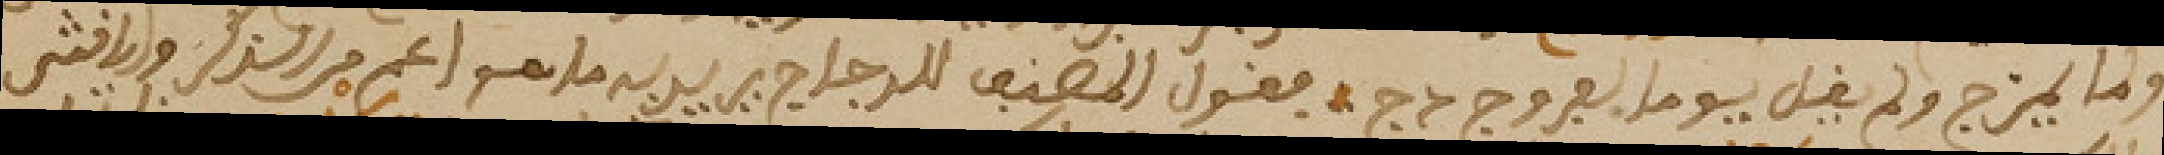ولما يمزج ولم يقل يوما لفروج ودج فقول المصنف للدجاج يريد به ما هو اعم من الذكر والا نثر
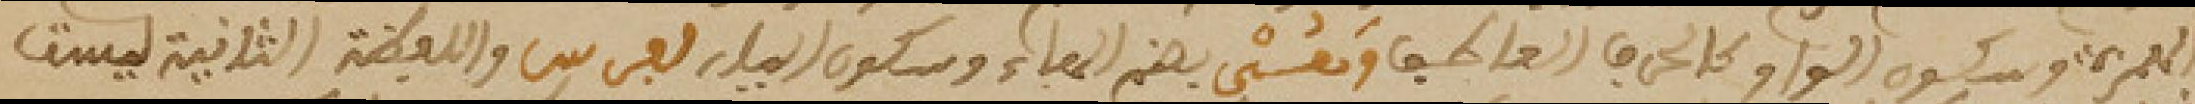الهمزة وسكون الواو كالحرف العاطف وهي بضم الهاء وسكون الياء لفرس واللفظة الثانية ليست
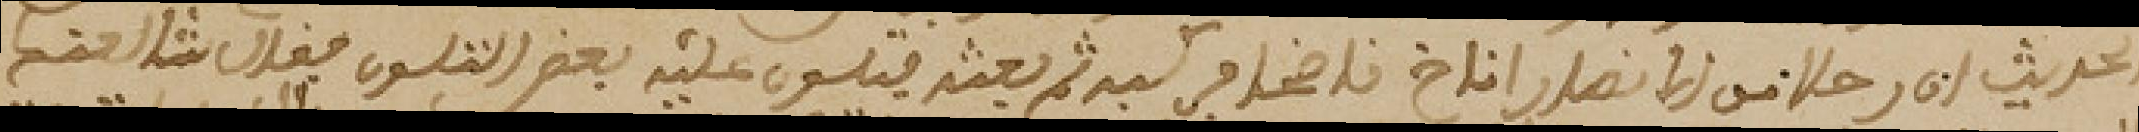الحديث ان رجلا من الأنصار اناخ ناضحا فركبه ثم بعثه فتلدن عليه بعض التلون فقال شأ لعنك
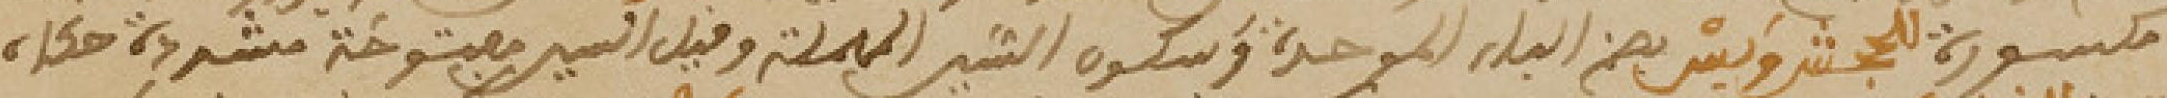مكسورة للجحش وبس بضم الباء الموحدة وسكون الشين المهملة وقيل السين مفتوحة مشددة حكاه
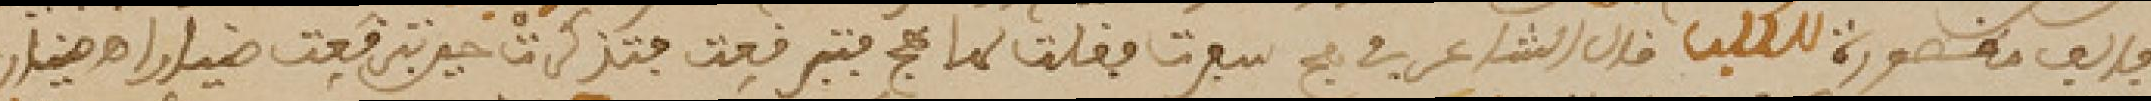فالف مقصورة للكلب قال الشاعر في هج سفرت فقلت لها هج فتبرقعت فتذكرت حين تبرقعت ضيارا وضيار
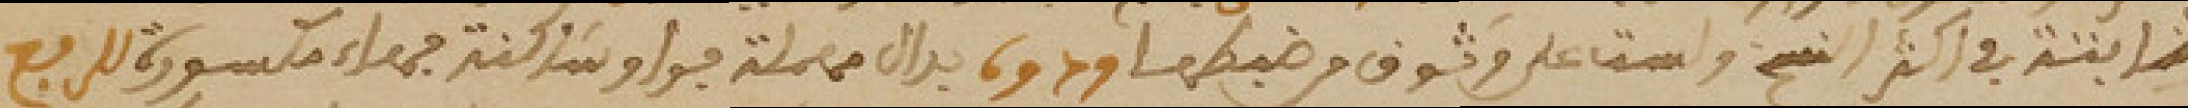ثابتة في اكثر النسخ وليست على وثوق من ضبطها ودوه بدال مهملة فواو ساكنة فهاء مكسورة للرفع
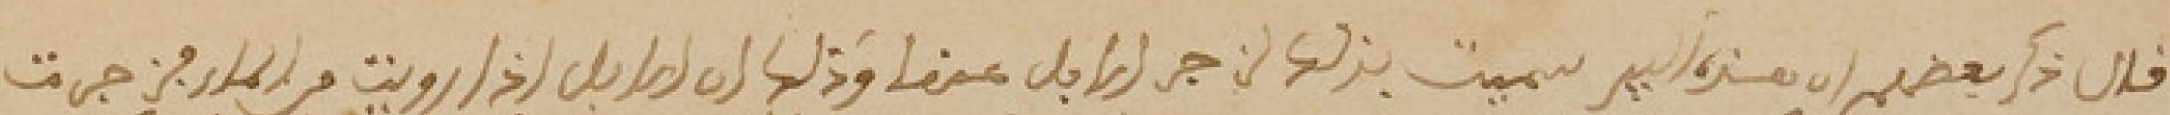قال ذكر بعضهم ان هذ اليس سميت بذلك لزجر الابل عنها وذلك ان الا بل اذا رويت من الماء فزجرت
